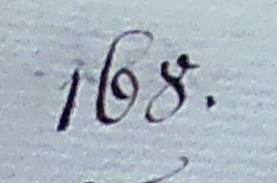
168.
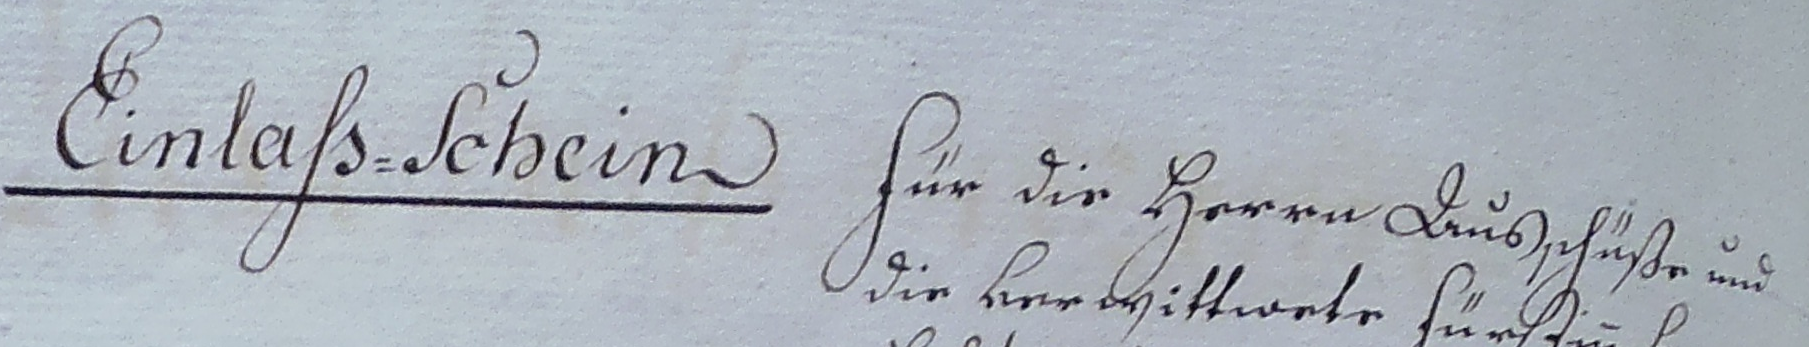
Einlass‗Schein Für die Herrn Ausschüße und
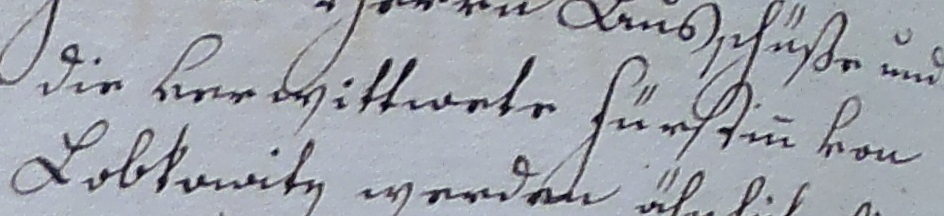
die verwittwete Fürstin̅ von
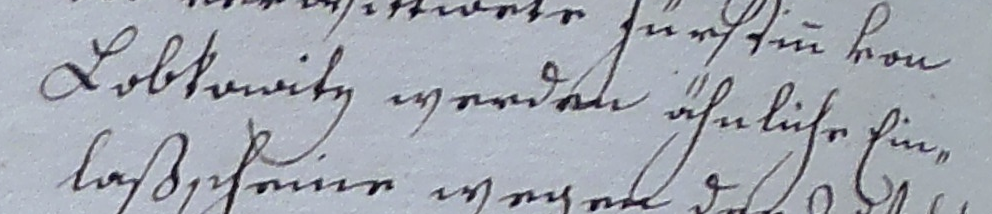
Lobkowitz werden ähnliche Einn¬
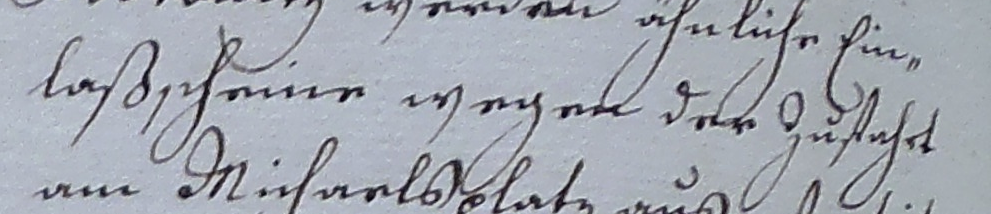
laßscheine wegen der Zufahrt
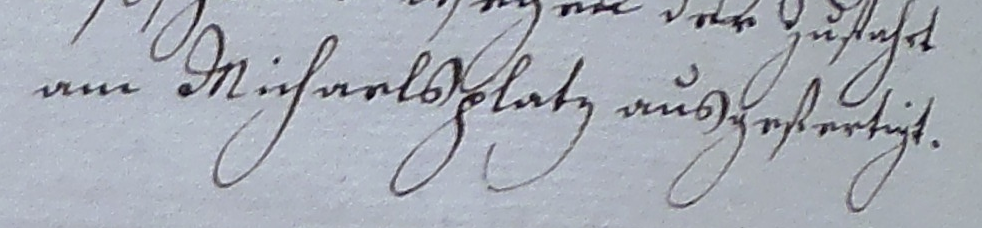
am Michaelsplatz ausgefertigt.
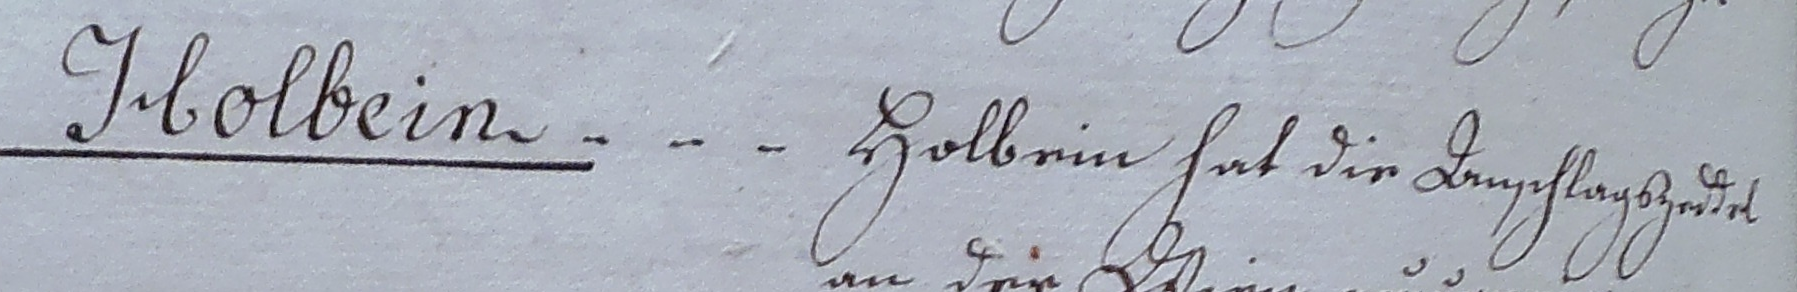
Holbein .. .. .. Holbein hat die Anschlagszeddel
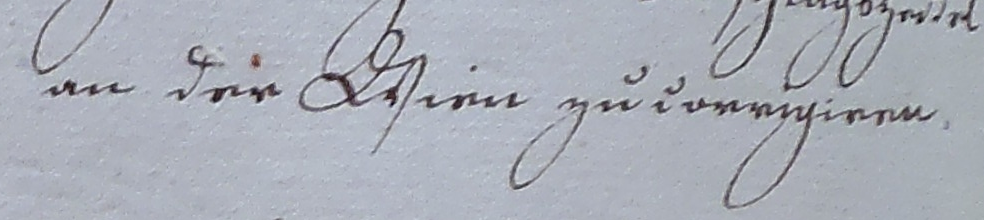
an der Wien zucorrigiren.
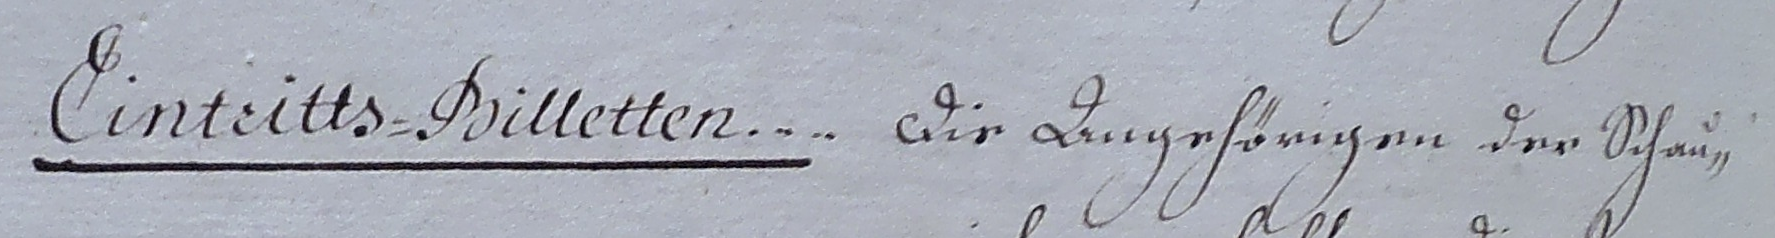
Eintritts‗Billetten. .. .. Die Angehörigen der Schau¬
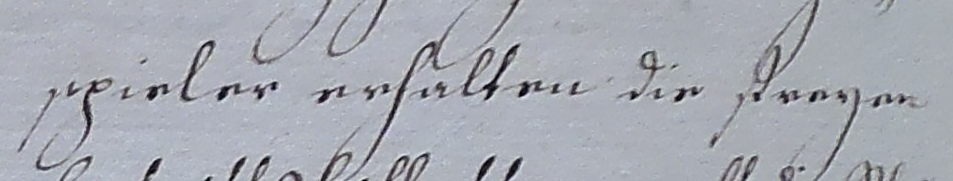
spieler erhalten die freyen
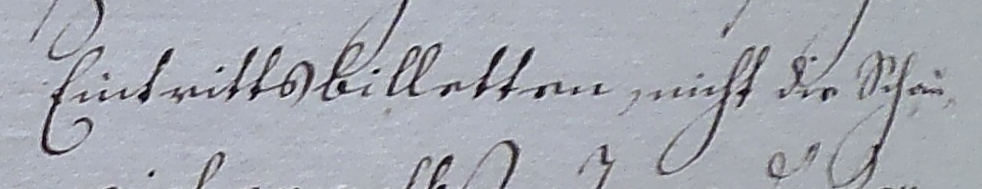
Eintrittsbilletten, nicht die Schau¬
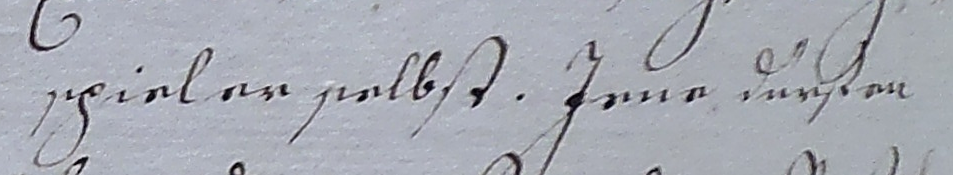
spieler selbst. Jene dürfen
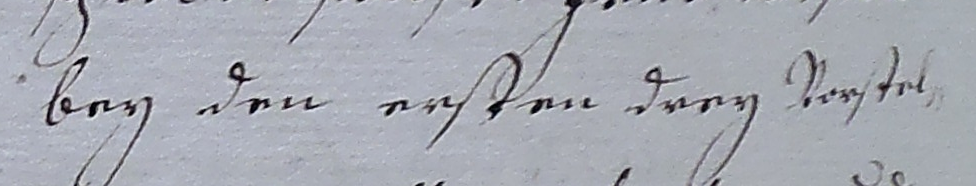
bey den ersten drey Vorstel¬
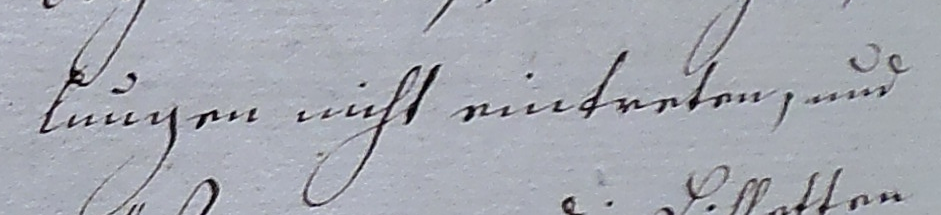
lungen nicht eintreten, und
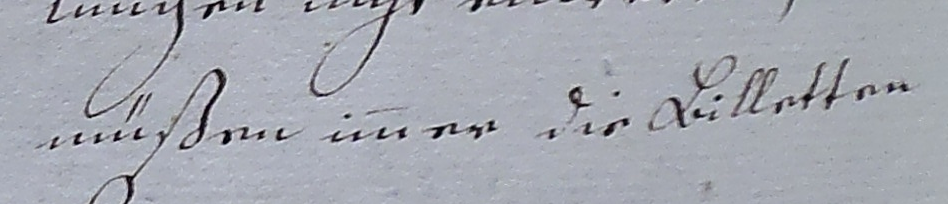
müßen im̅er die Billetten
